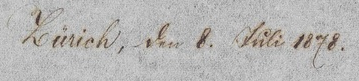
Zürich, den 8. Juli 1878.
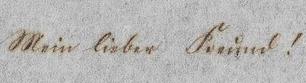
Mein lieber Freund!
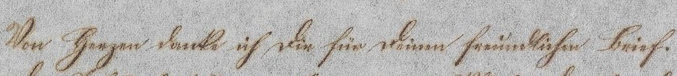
Von Herzen danke ich Dir für Deinen freundlichen Brief.
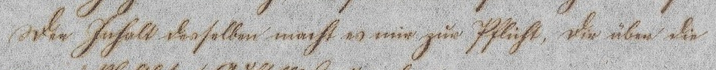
Der Inhalt desselben macht es mir zur Pflicht, Dir über die
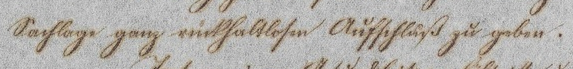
Sachlage ganz rückhaltlosen Aufschluß zu geben.
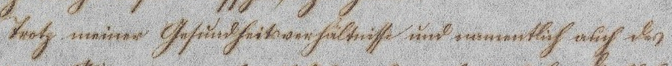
Trotz meiner Gesundheitsverhältnisse und namentlich auch des
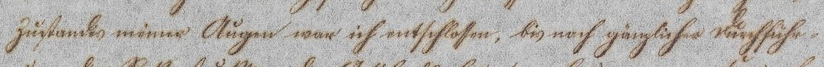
Zustandes meiner Augen war ich entschlossen, bis nach gänzlicher Durchführ-
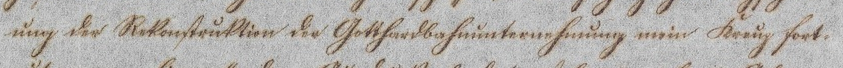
ung der Rekonstruktion der Gotthardbahnunternehmung mein Kreuz fort-
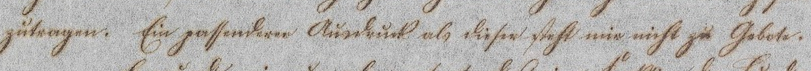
zutragen. Ein passenderer Ausdruck als dieser steht mir nicht zu Gebote.
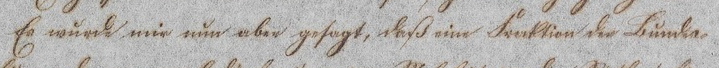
Es wurde mir nun aber gesagt, daß eine Fraktion der Bundes-
